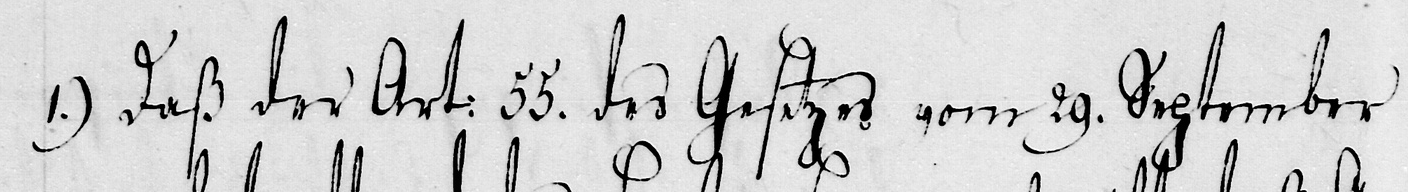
1.) Daß der Art: 55 des Gesetzes vom 29. September
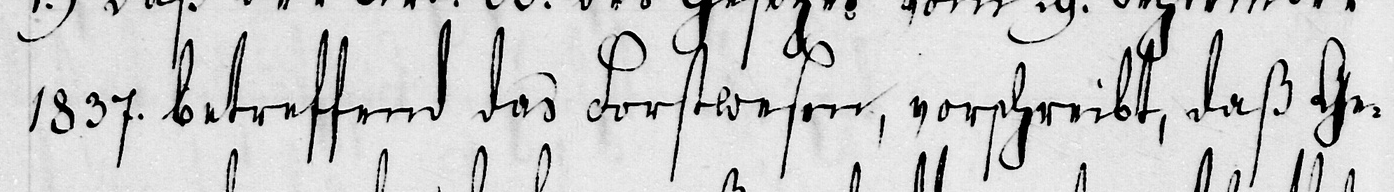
1837. betreffend das Forstwesen, vorschreibt, daß Ge¬
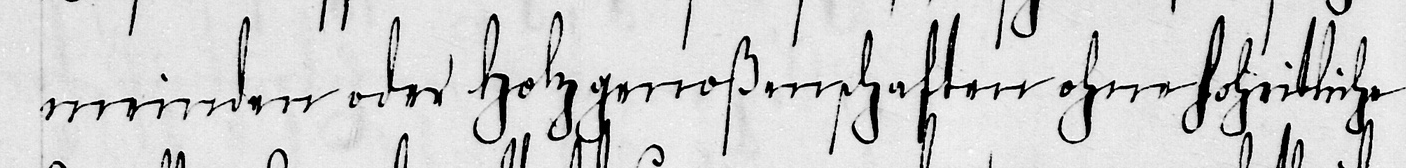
meinden oder Holzgenoßenschaften ohne hoheitlic¬
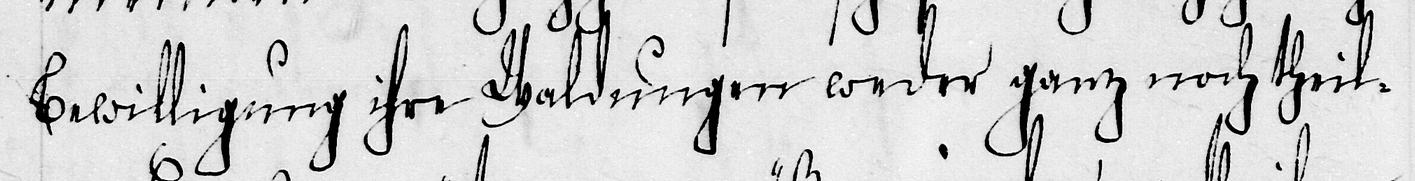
Bewilligung ihre Waldungen weder ganz noch theil¬
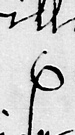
he
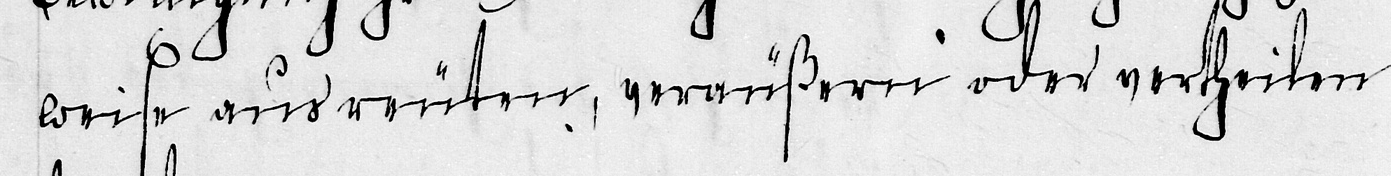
weise ausreuten, veräußern oder vertheilen
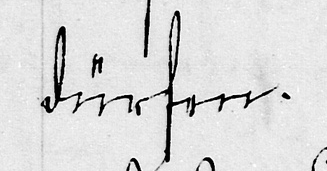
dürfen.
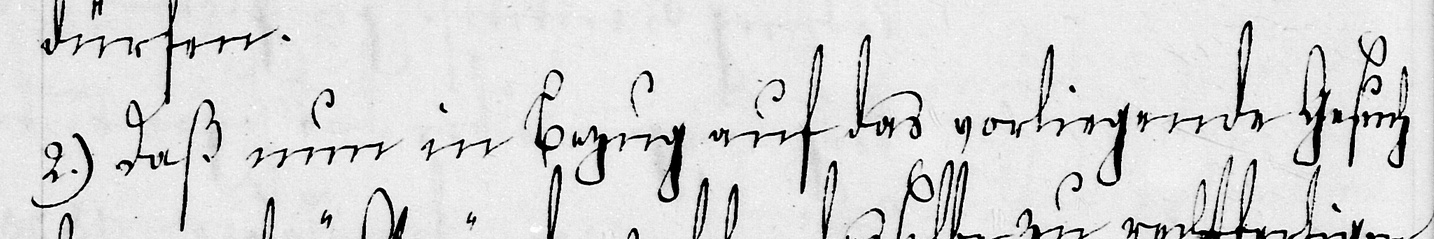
2.) Daß nun in Bezug auf das vorliegende Gesuch
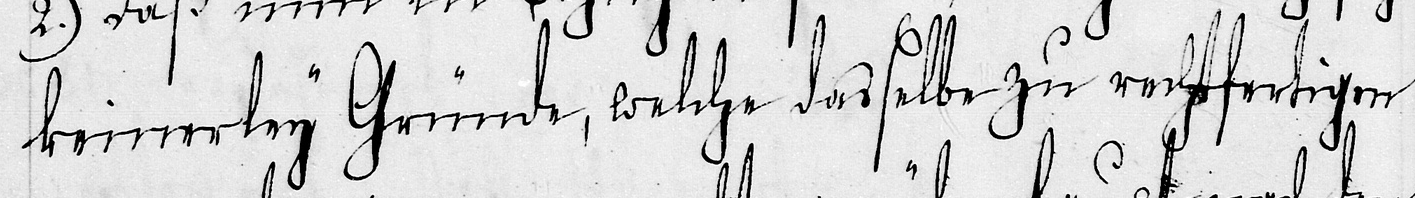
keinerley Gründe, welche dasselbe zu rechtfertigen
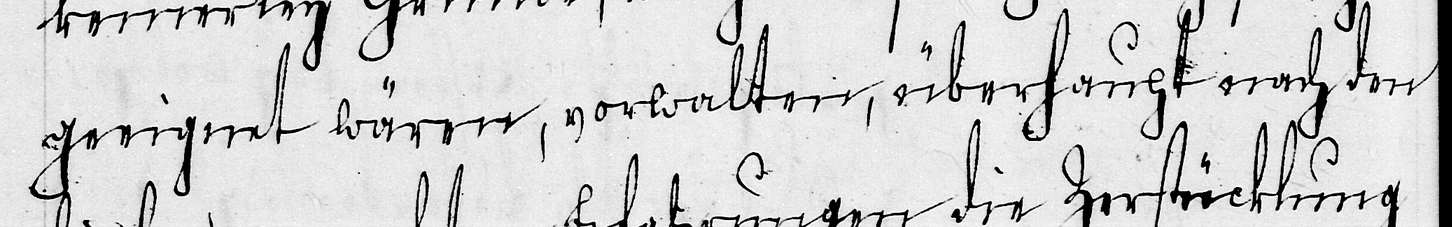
geeignet wären, vorwalten, überhaupt nach den
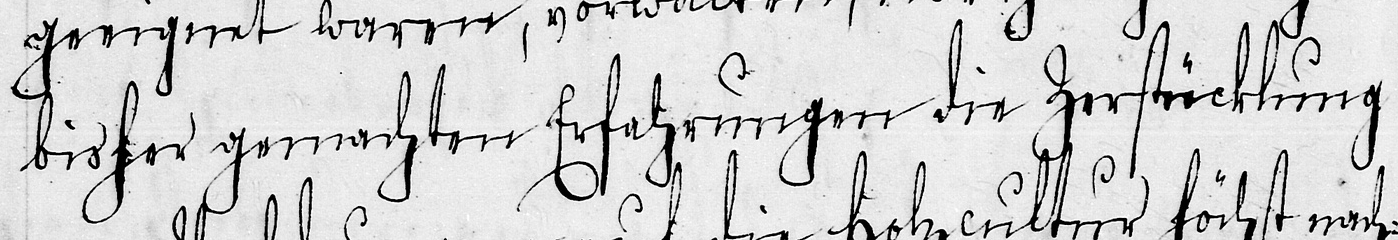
bisher gemachten Erfahrungen die Zerstücklung
